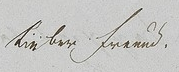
Lieber Freund.
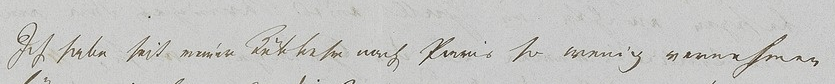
Ich habe seit meiner Rükkehr nach Paris so wenig vernehmen
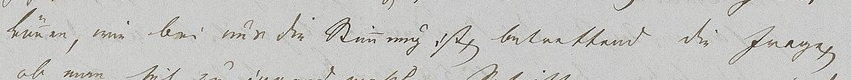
können, wie bei uns die Stimmung ist, betreffend die Frage,
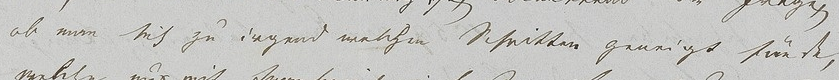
ob man sich zu irgend welchen Schritten geneigt fände,
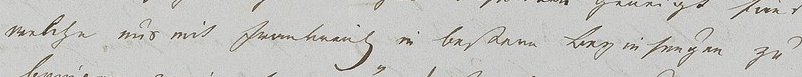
welche uns mit Frankreich in beßere Beziehungen zu
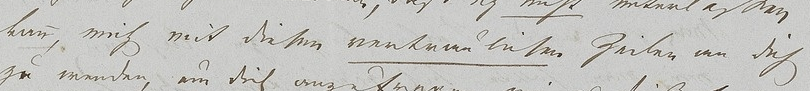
kann, mich mit diesen vertraulichen Zeilen an dich
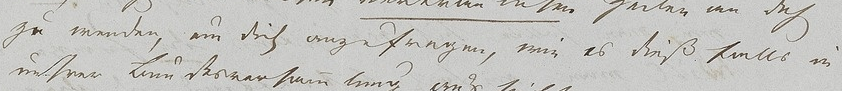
zu wenden, um dich anzufragen, wie es dießfalls in
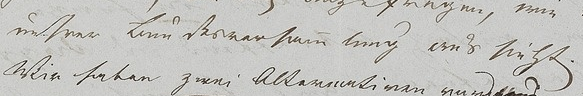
unsrer Bundesversammlung aussieht. –
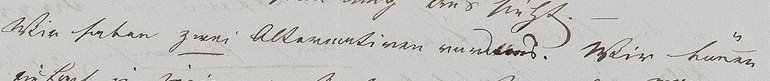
Wir haben zwei Alternativen vor uns. Wir können
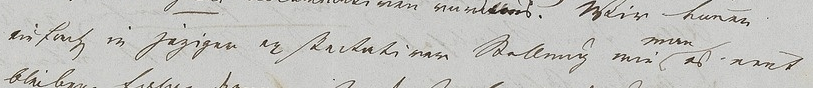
einfach in jeziger exspectativer Stellung wie man es nennt
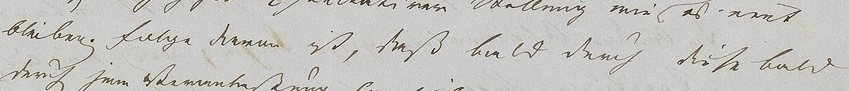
bleiben. Folge davon ist, daß bald durch diese bald
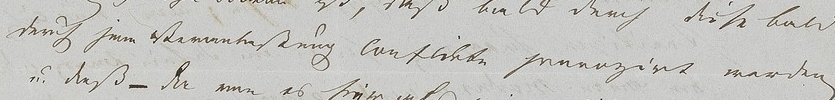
durch jene Veranlaßung Conflikte provozirt werden
